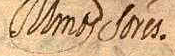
Ill̄mos Sorēs.
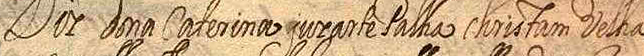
Diz dona Caterina juzarte Palha christam Velha
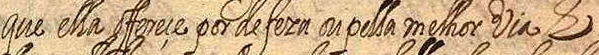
que ella offerece por defeza ou pella melhor Via E
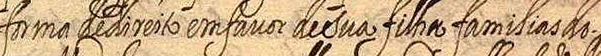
forma de direito em fauor de sua filha familiar do
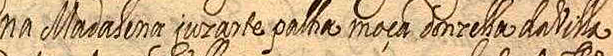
na Madalena juzarte palha moça donzella da Villa
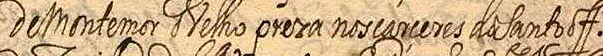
de montemor o Velho preza nos carceres do Santo off.o
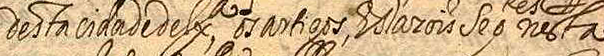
desta cidade de lxa, os artigos, E Razoīs segtes nesta
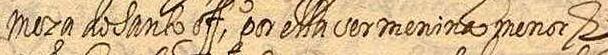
meza do santo offo, por ella ser menina menor E
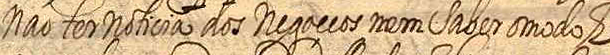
não ter noticia dos negoceos nem saber o modo E
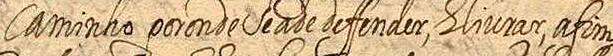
caminho por onde se ade deffender, E liurar, a fim
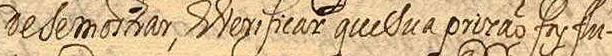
de se mostrar, E Verificar que sua prizão foy flu
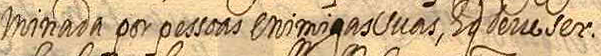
minada por pessoas enimigas suas, E q̄ deue ser
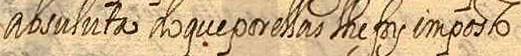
absuluta do que por ellas lhe foy imposto
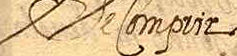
E se Comprir
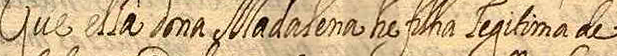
Que ella dona Madalena he filha legitima de
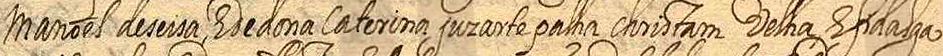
manoel de seisa, E de dona caterina juzarte palha christam Velha, E fidalga
